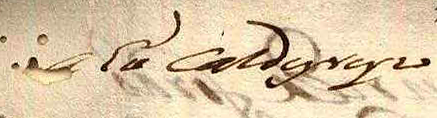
a hū caldejreyro
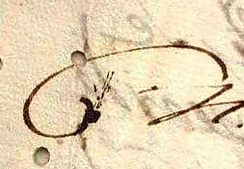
C. n.
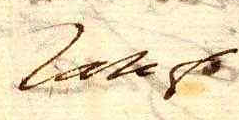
Ratef
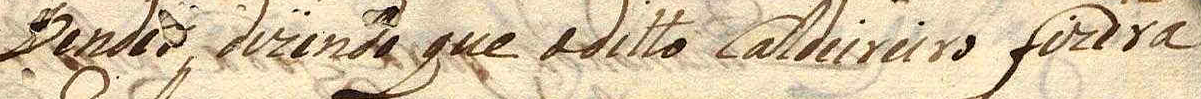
Vender dizendo que o ditto caldeireiro fizera
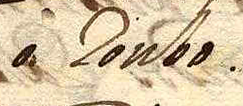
o Roubo.
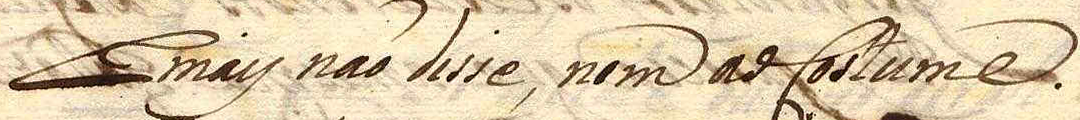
E mais nao disse, nem ao Costume.
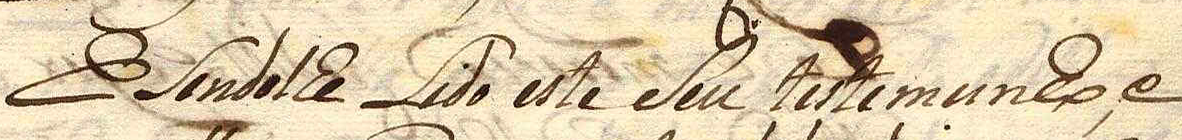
E sendolhe Lido este Seu testemunho, e
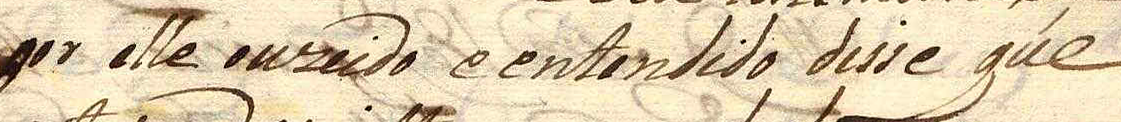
por elle ouvido e entendido disse que
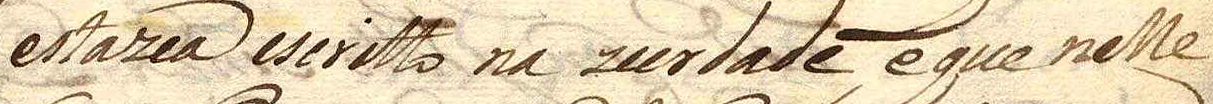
estava escritto na verdade, e que nelle
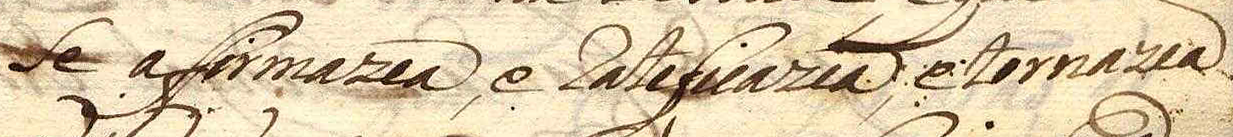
se affirmava, e Rateficava, e tornava
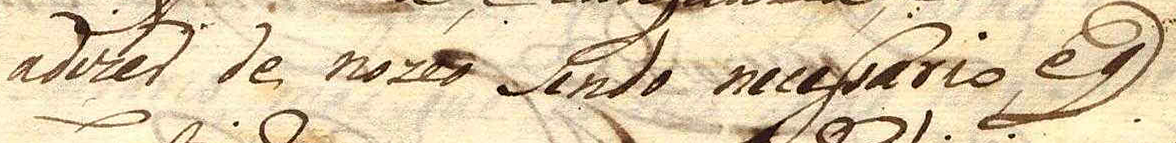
a dizer de novo sendo necessario, e q̄
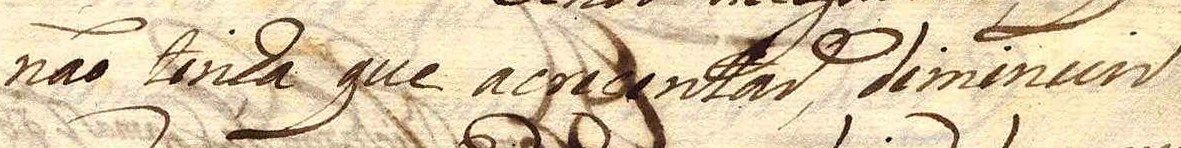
naõ tinha que acrecentar, diminuir
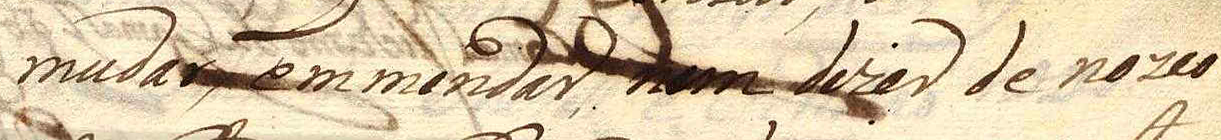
mudar, emmendar, nem dizer de novo
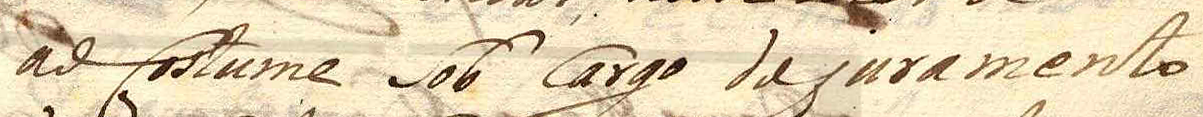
ao Costume sob cargo do juramento
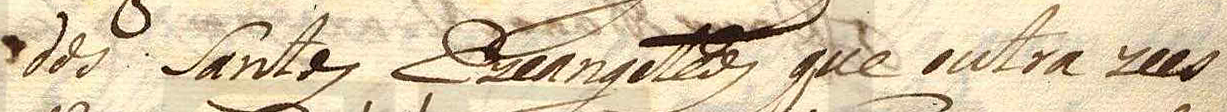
dos Santos Evangelhos que outra ves
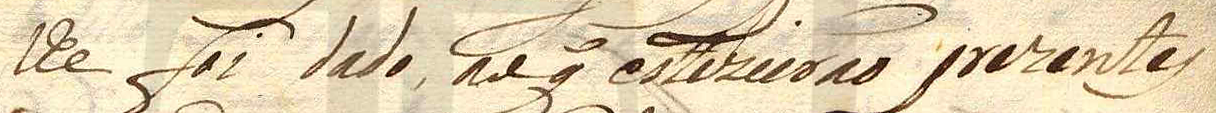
lhe foi dado, ao q̄ estiveraõ prezentes
